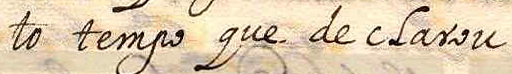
to tempo que declarou
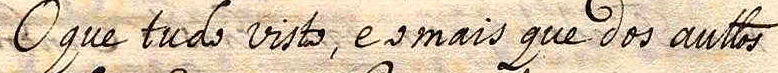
O que tudo visto, e o mais que dos auttos
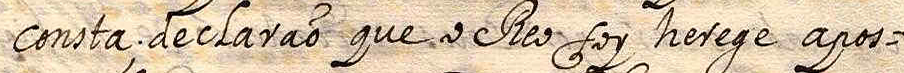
consta; declaraõ que o Reo foy herege apos
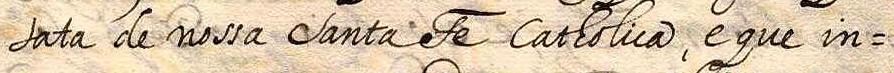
tata de nossa Santa Fe Catholica, e que in
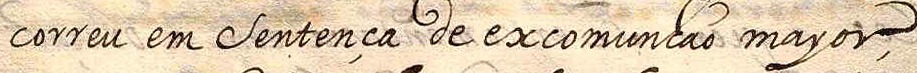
correu em Sentença de excomunhão mayor,
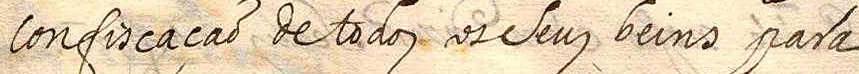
confiscaçaõ de todos os seus beins para
